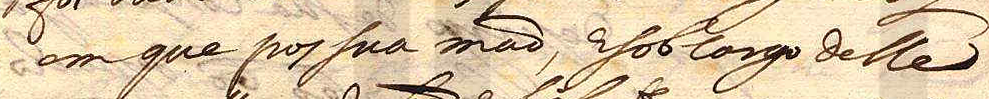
em que pos sua mão, E sob cargo delle
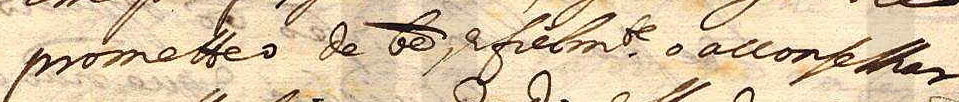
prometteo de bē e fielm.te o acconselhar
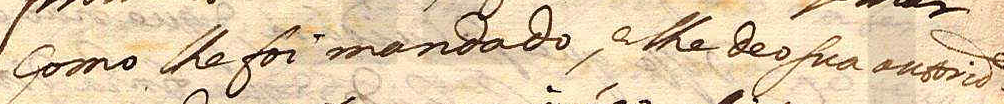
como lhe foi mandado, E lhe deo sua autoride.
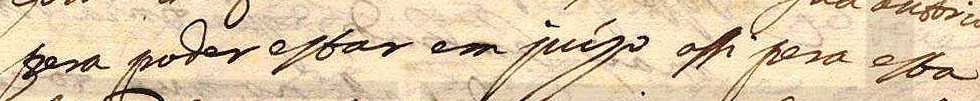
pera poder estar em juizo assi pera esta
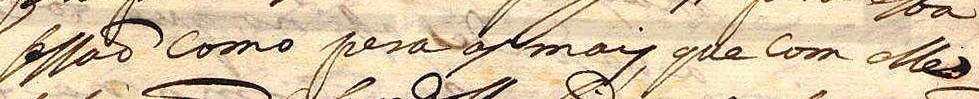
sessaõ, como pera as mais, que com elle
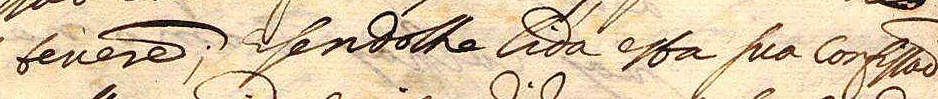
se teuerē, E sendolhe lida esta sua confissão
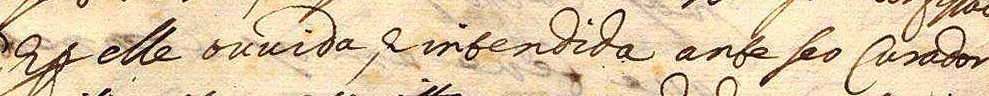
E ꝑ elle ouuida, e intendida ante seo Curador
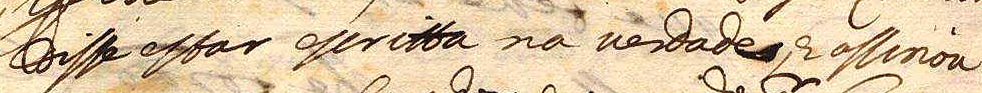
disse estar escritta na uerdade, E assinou
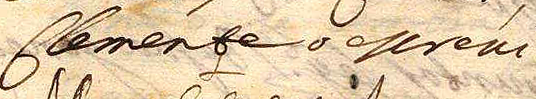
Clemente o escreui
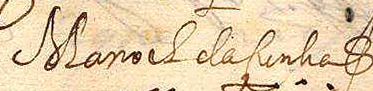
Manoel da Cunha
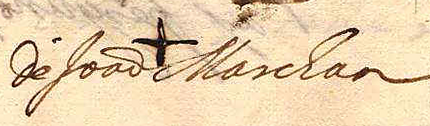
de Joaõ Marchan
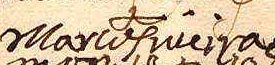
Marcos uieira
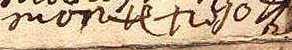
monteRojo
